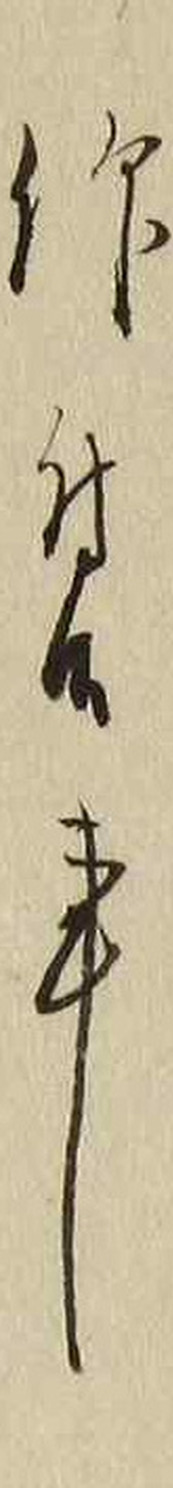仰付候事
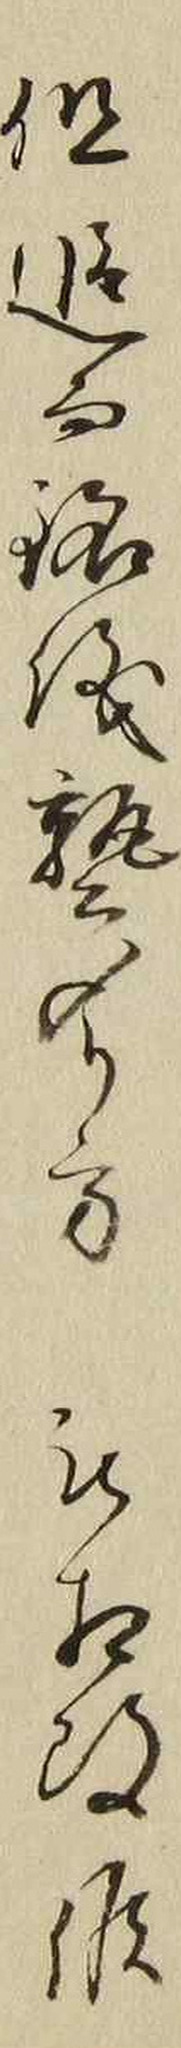但追而銘儀塾〆り方被相改候
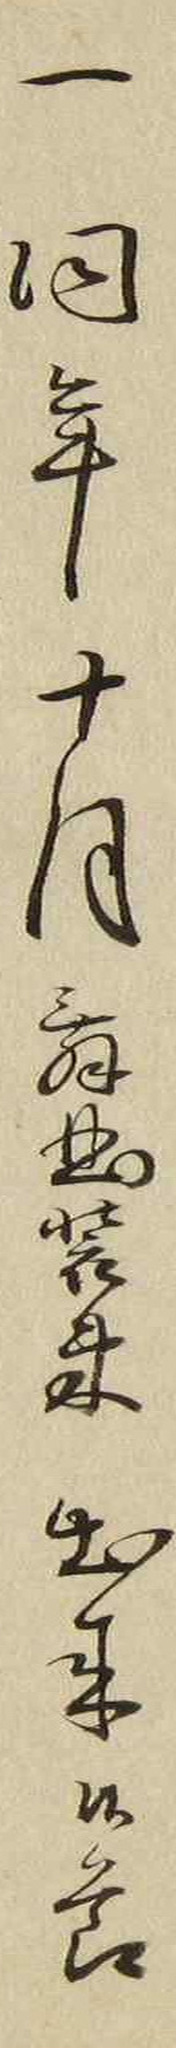一同年十月舞曲装束出来候節
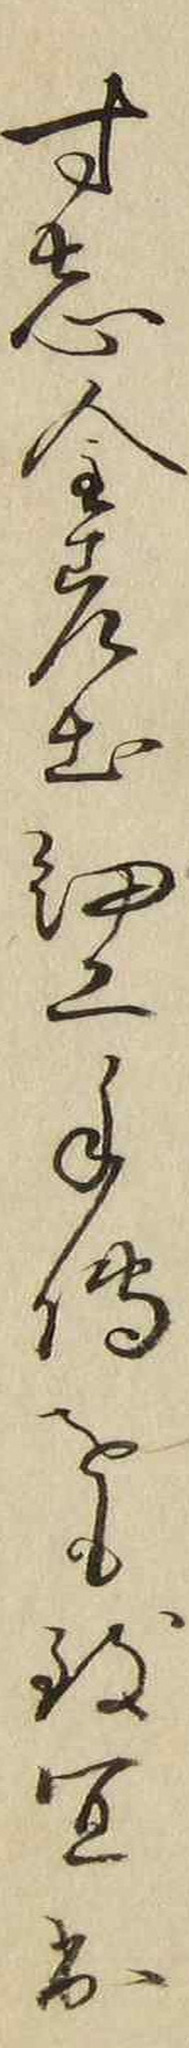寸志金差出細工手伝をも致宜出

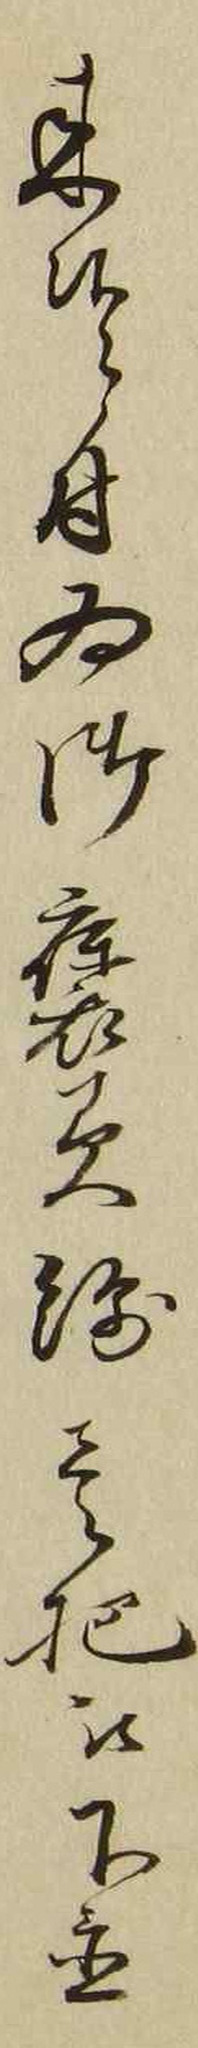来候に付為御褒美綿壱把被下置
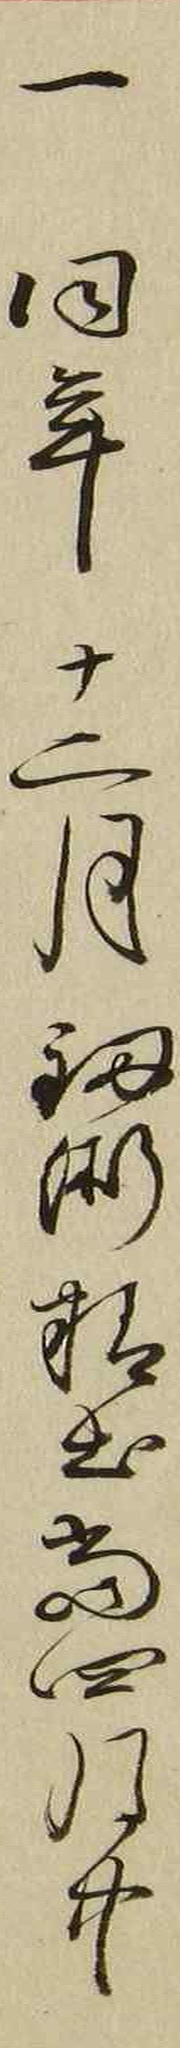一同年十二月剣術精出当四月中
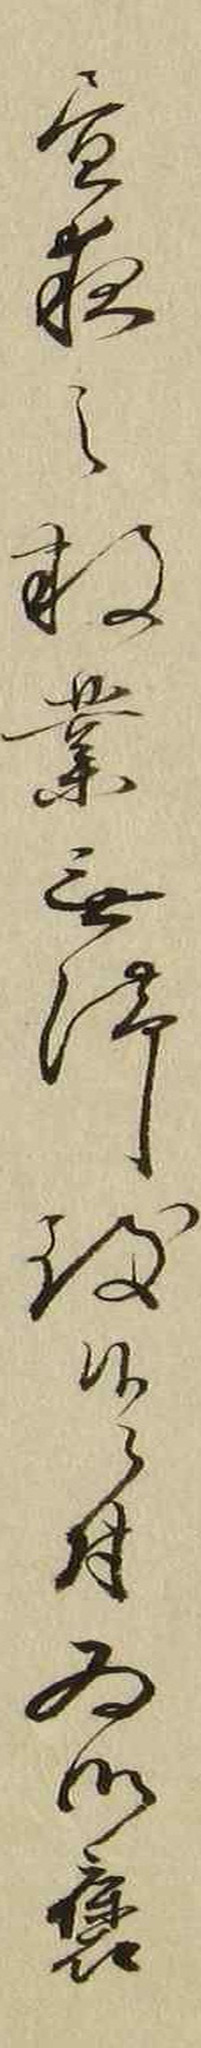昼夜の数業無滞致候に付為御褒
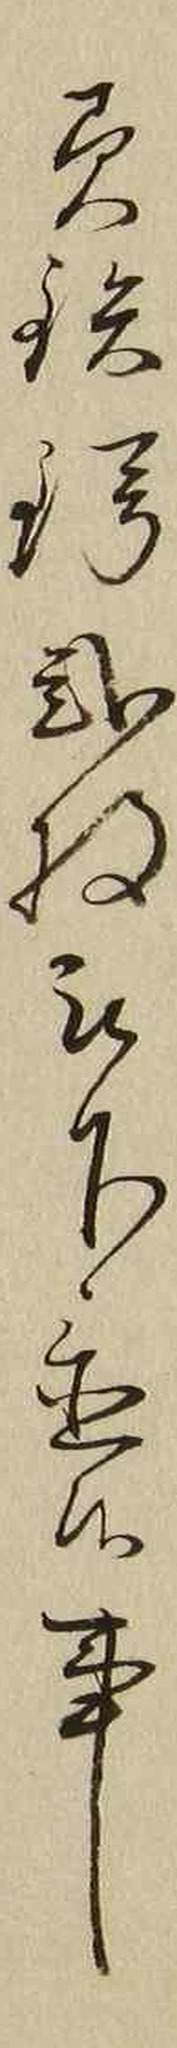美鉄鍔弐枚被下置候事
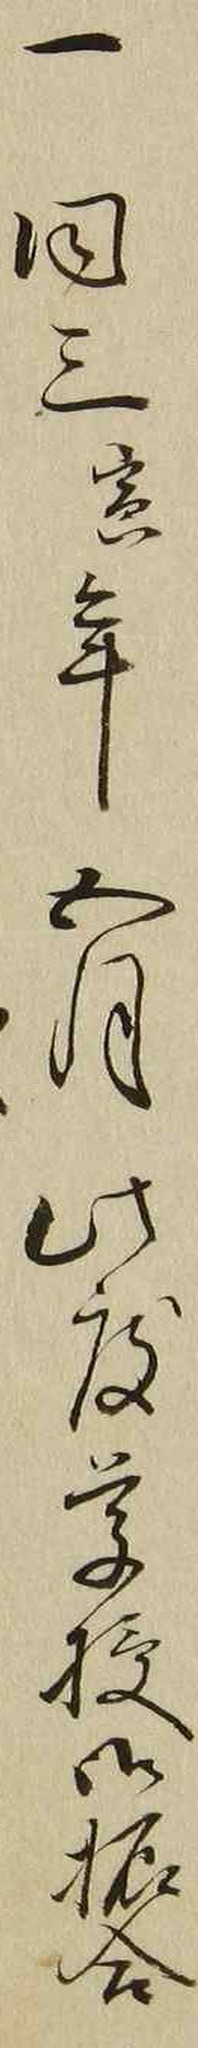一同三寅年五月此度学授御振合
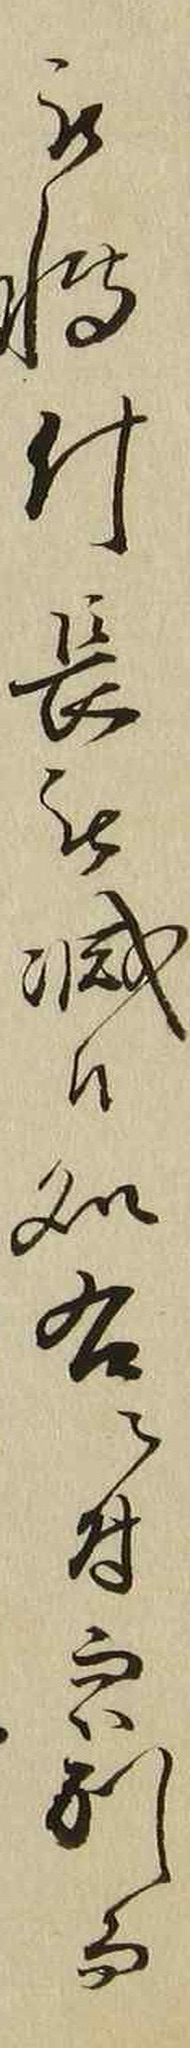被転什長被減候処右に付而は別而
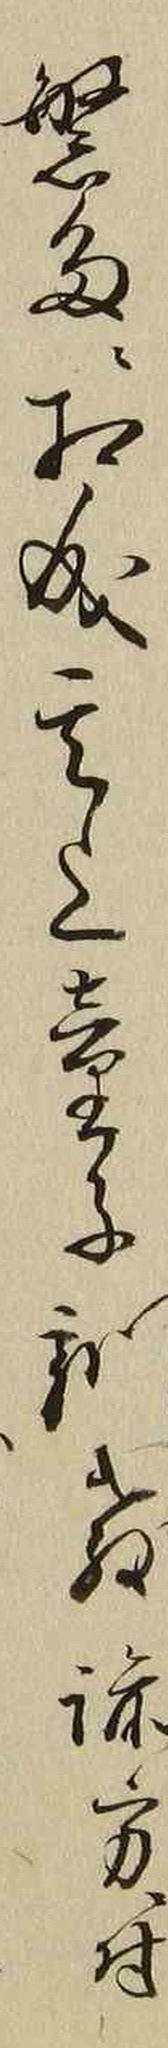繁多に相成其上童子訓教諭方に付
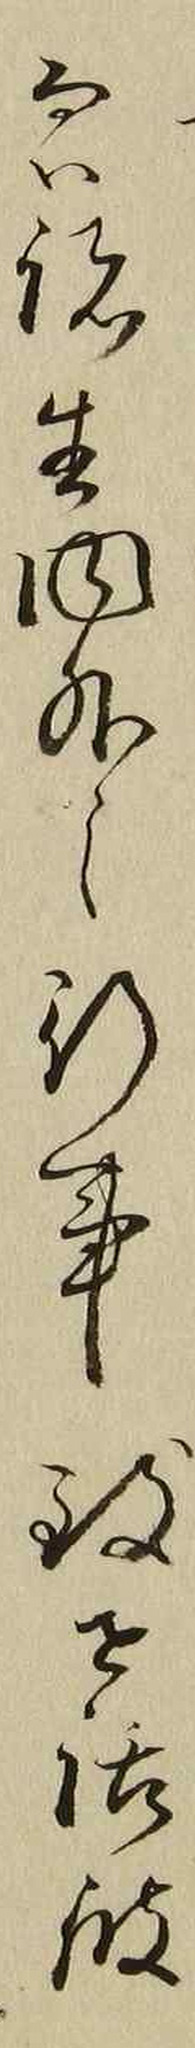而は諸生内外の行事致世話彼
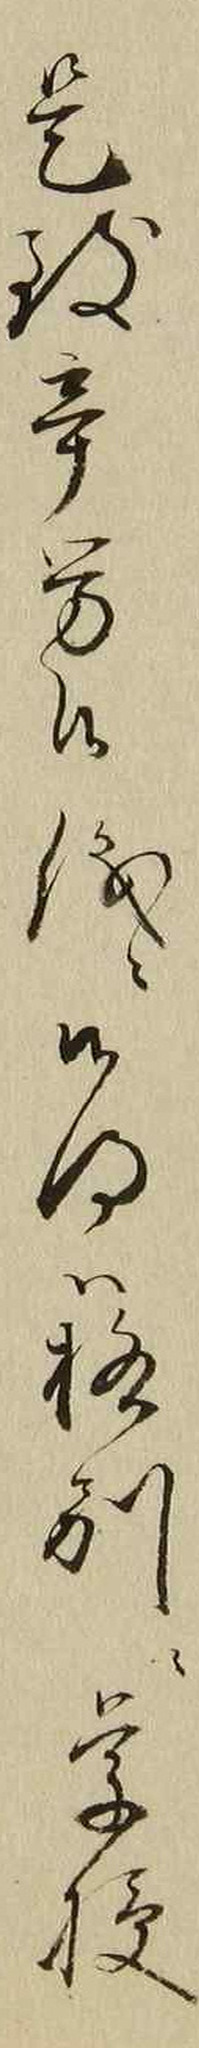是致辛労候儀に候得は格別に学授
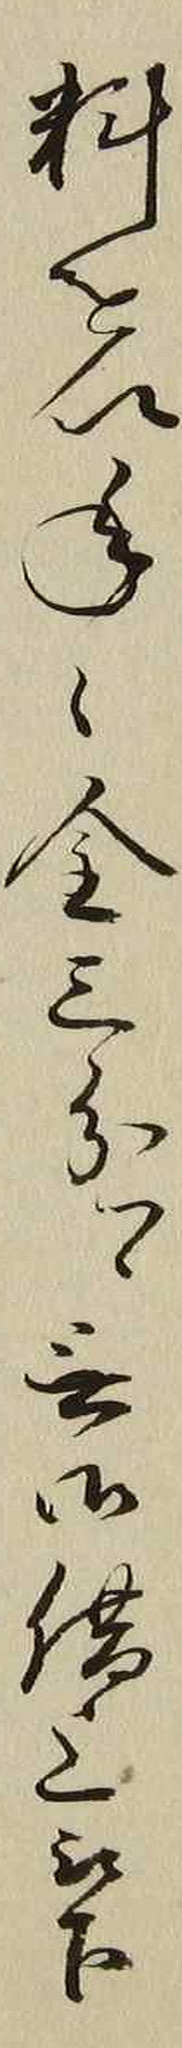料を以年々金三分ツヽ無御借上被下
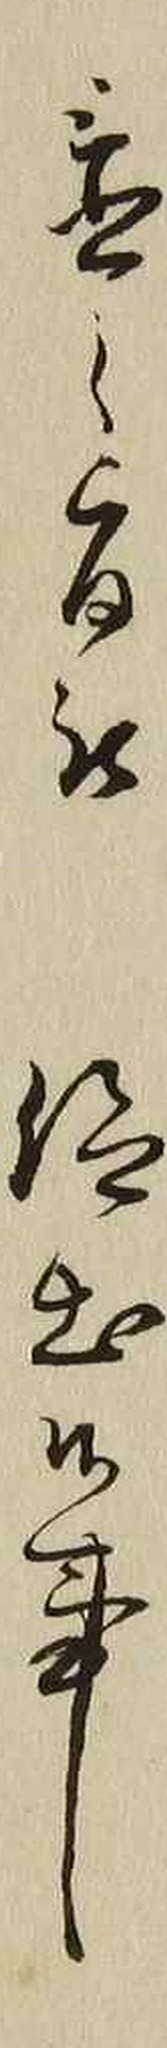置の旨被仰出候事
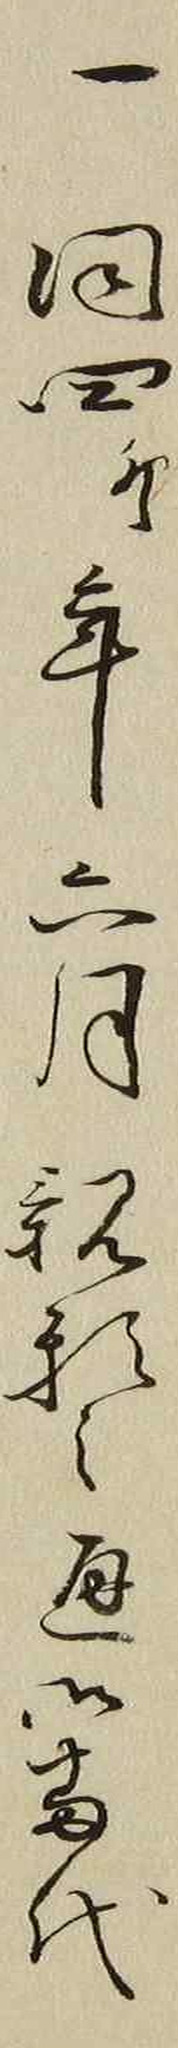一同四卯年六月親願の通御番代
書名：諸士系譜　巻之1　い之部1
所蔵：会津若松市立会津図書館
